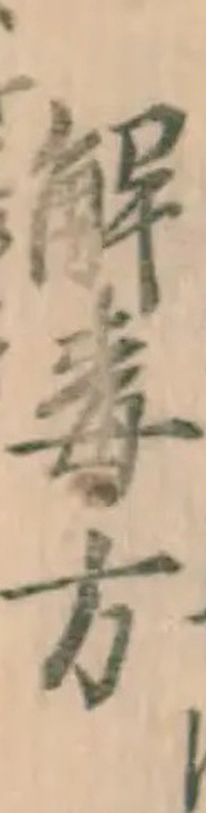解毒方
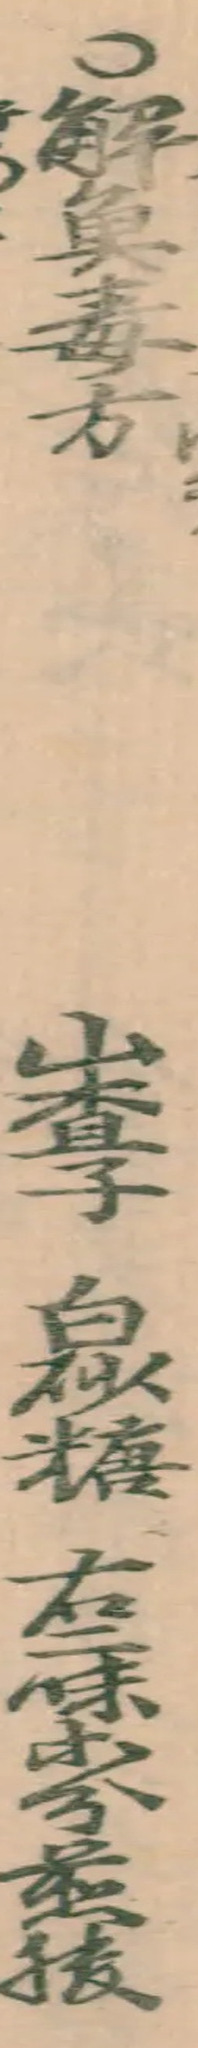○解魚毒方山査子白砂糖右二味等分煎服
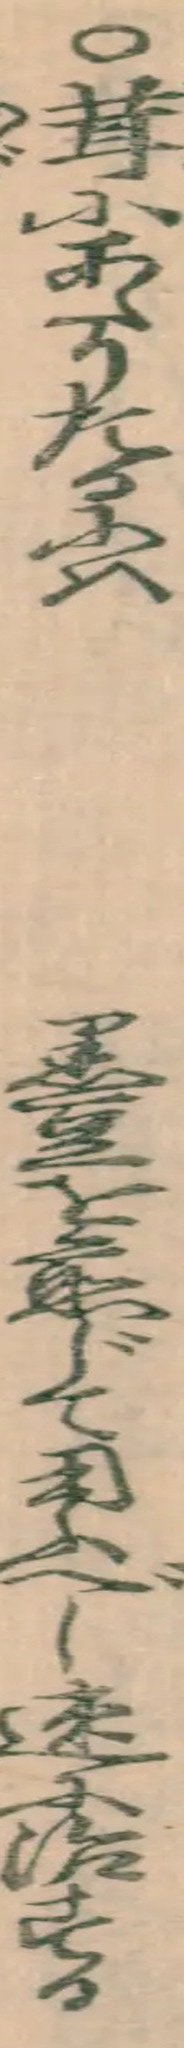○茸にあたりたるには黒豆を煎じて用ふべし速に治する
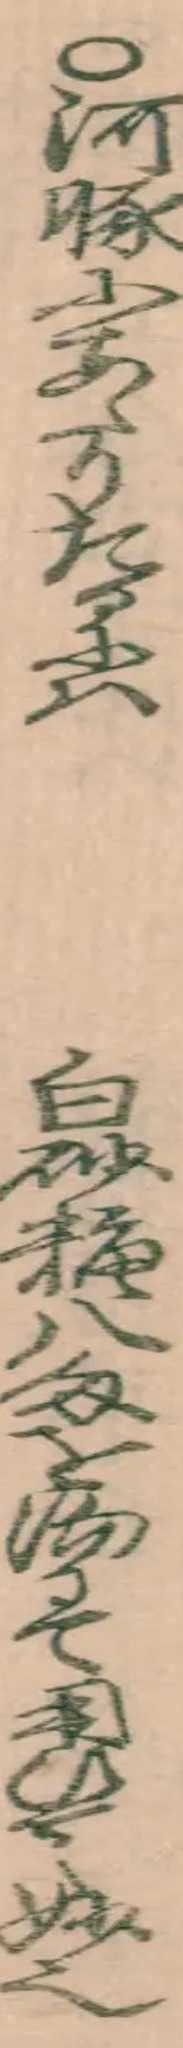○河豚にあたりたるには白砂糖八匁を湯にて用ひて妙也
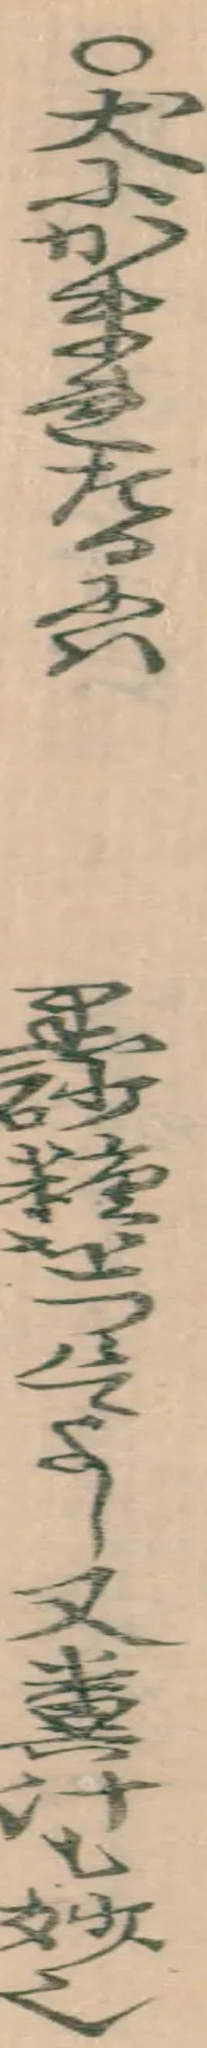○犬にかまれたるには黒砂糖をつけてよし又糞汁も妙也
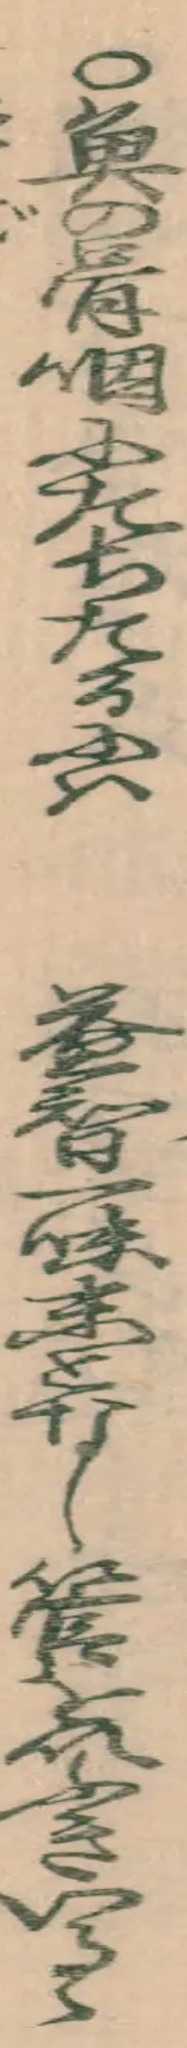○魚の骨咽にたちたるには益智一味末となし管を以ふきいるゝ
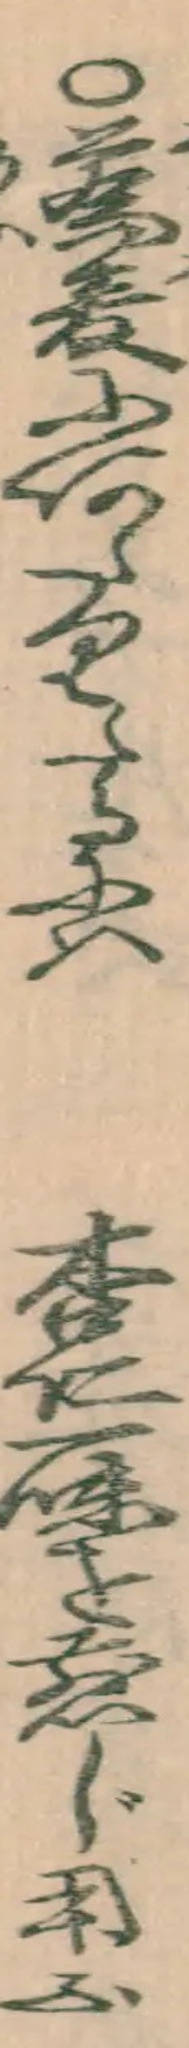○蕎麦にあたりたるには杏仁一味を煎じ用ふ
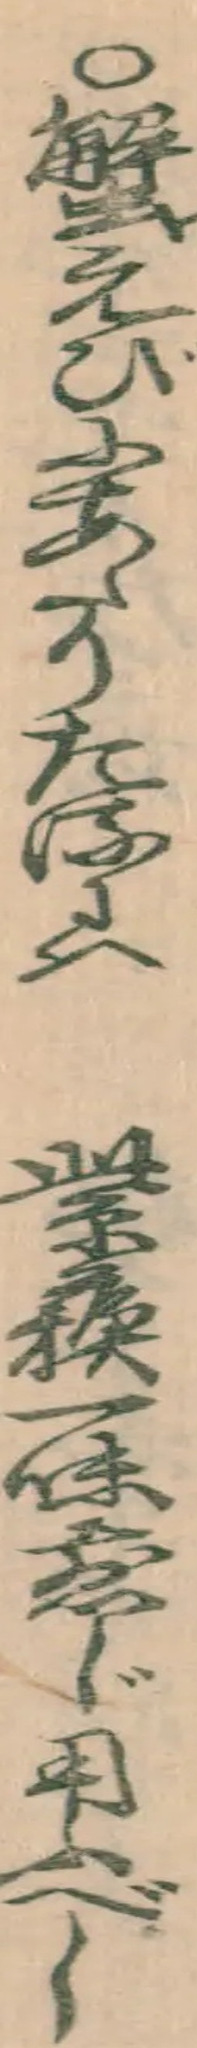○蟹えびにあたりたるには紫蘇一味煎じ用ふべし
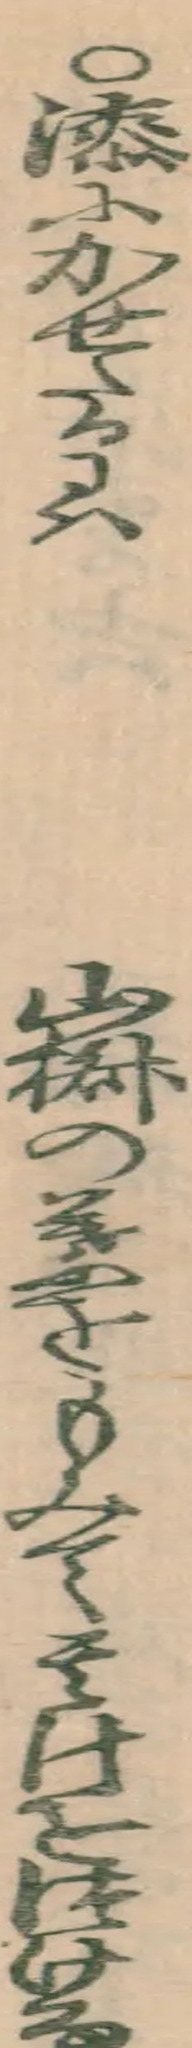○漆にかせたるには山桝の葉をもみて其汁をつける
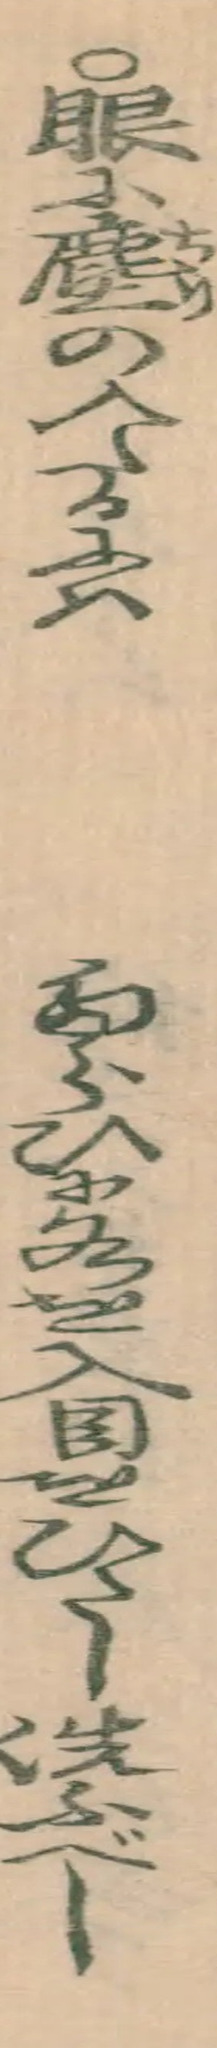○眼に塵の入たるにはたらひに水を入れ目をひたし洗ふべし
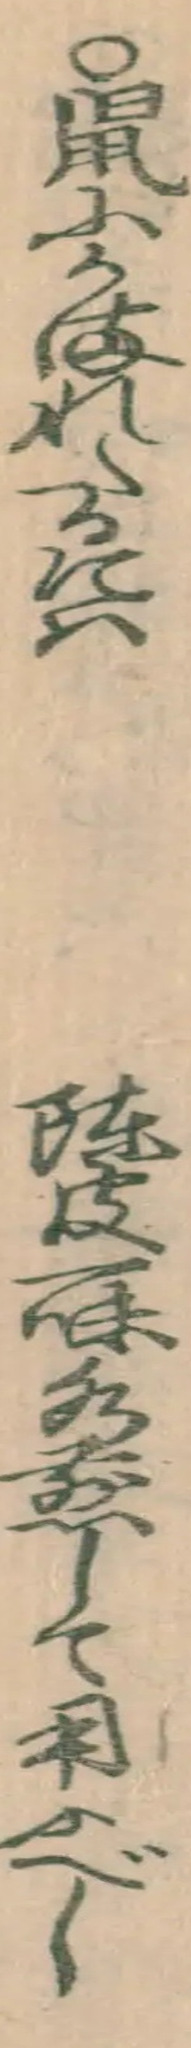○鼠にかまれたるには陳皮一味水煎して用ふべし
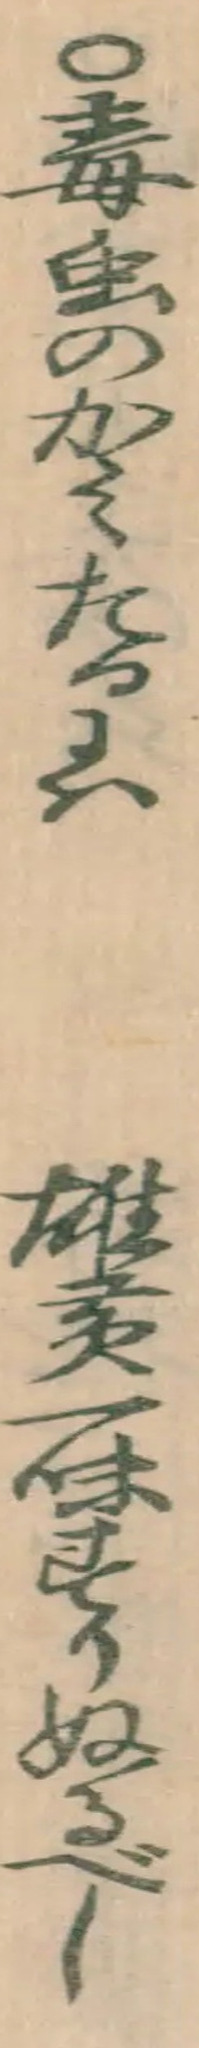○毒虫のかみたるには雄黄一味すりぬるべし
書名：日ごとの心得
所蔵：国立国会図書館 National Diet Library, JAPAN
